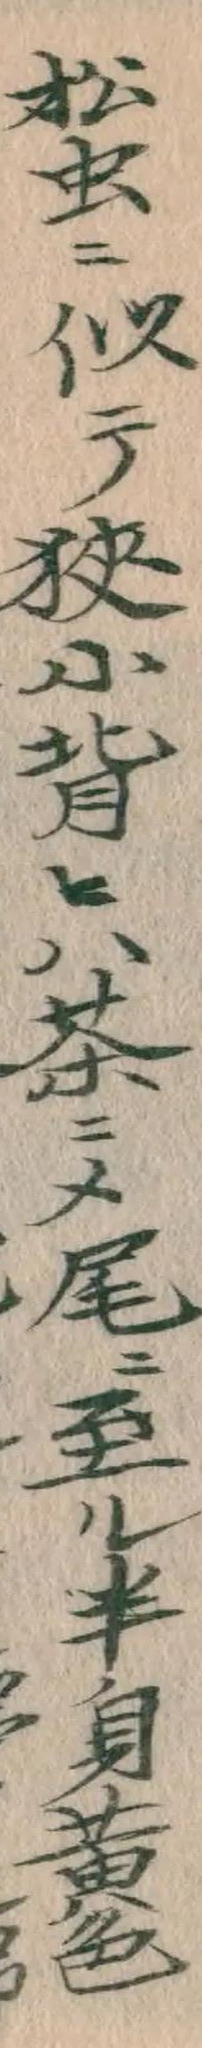松虫ニ似テ狭小背ヒハ茶ニシテ尾ニ至ル半身黄色
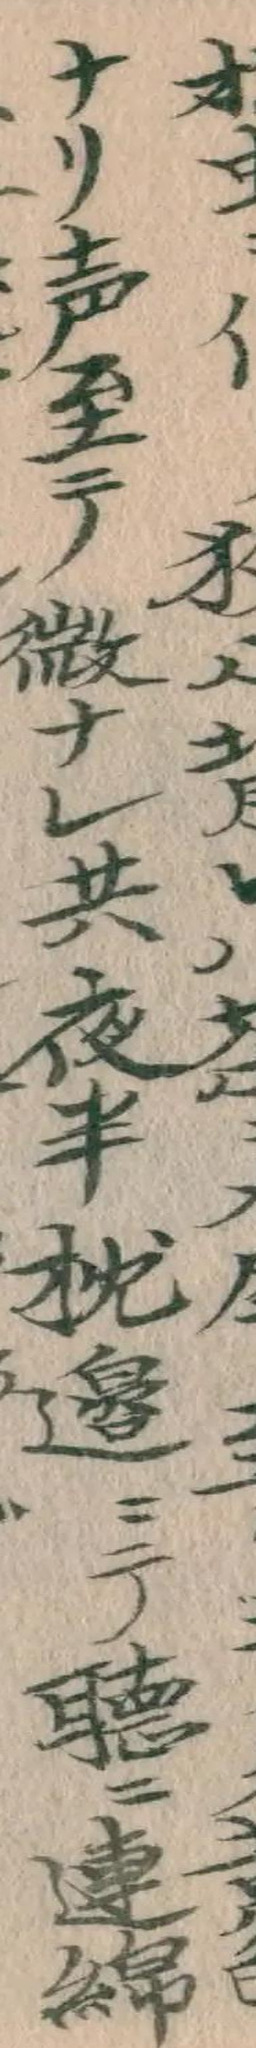ナリ声至テ微ナレ共夜半枕邊ニテ聴ニ連綿
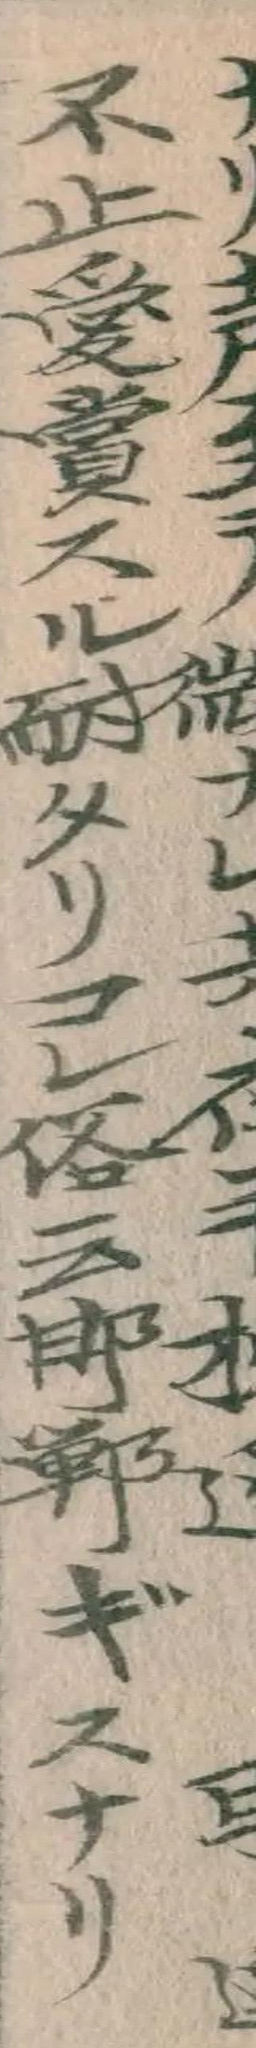不止愛賞スル耐タリコレ俗云邯鄲ギスナリ
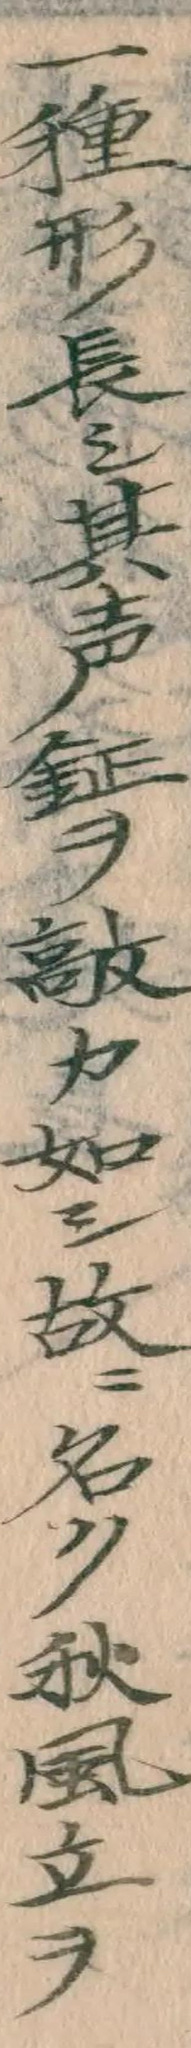一種形長シ其声鉦ヲ敲カ如シ故ニ名ク秋風立ヲ
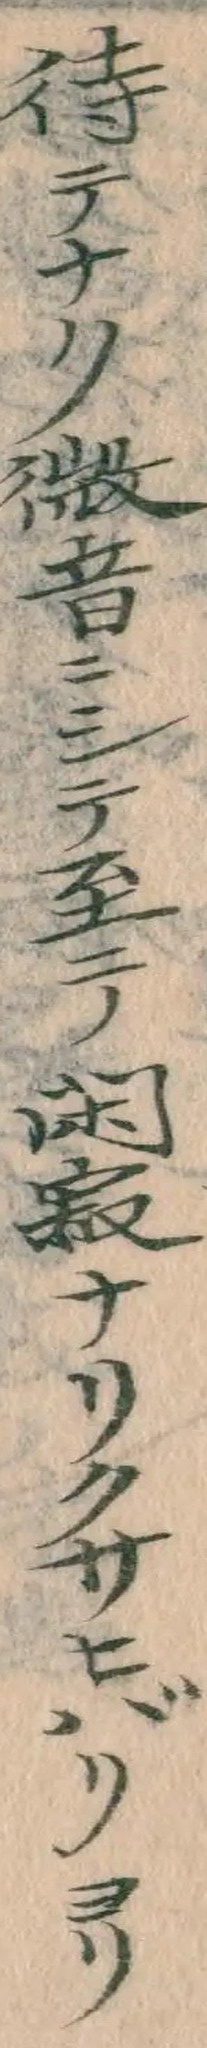待テナク微音ニシテ至テ閑寂ナリクサヒバリヨリ
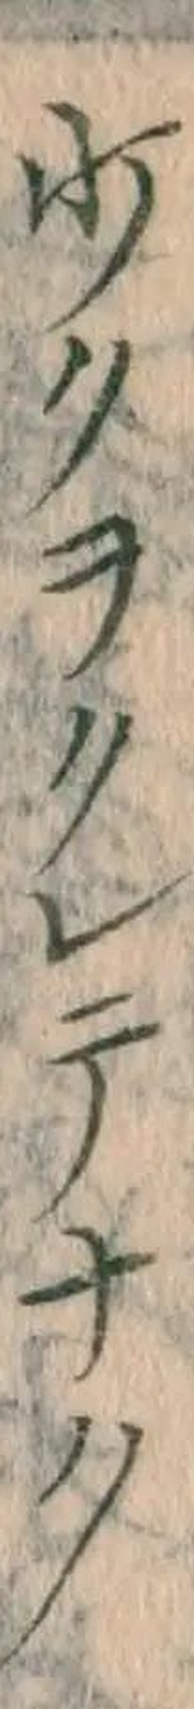少クヲクレテナク

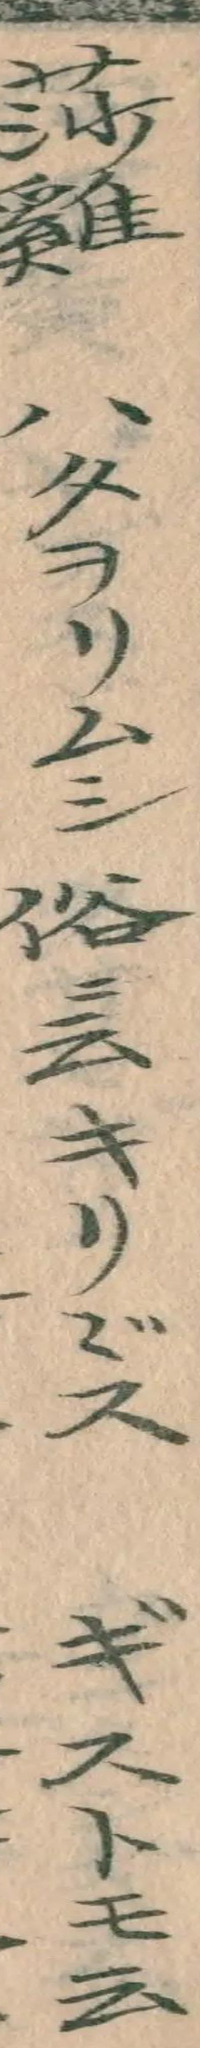莎鶏ハタヲリムシ俗ニキリ々スギストモ云
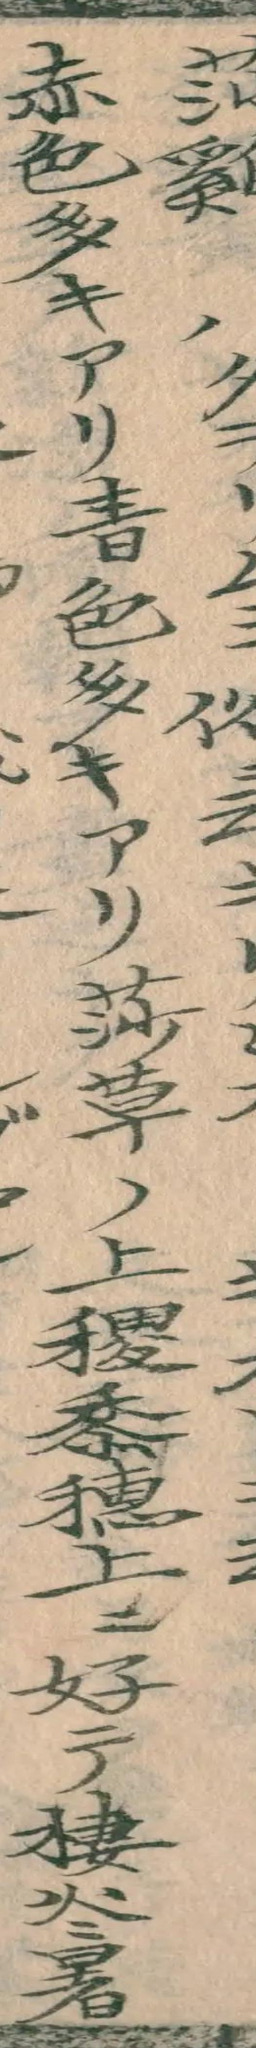赤色多キアリ青色多キアリ莎草ノ上稷黍穂上ニ好テ棲炎暑
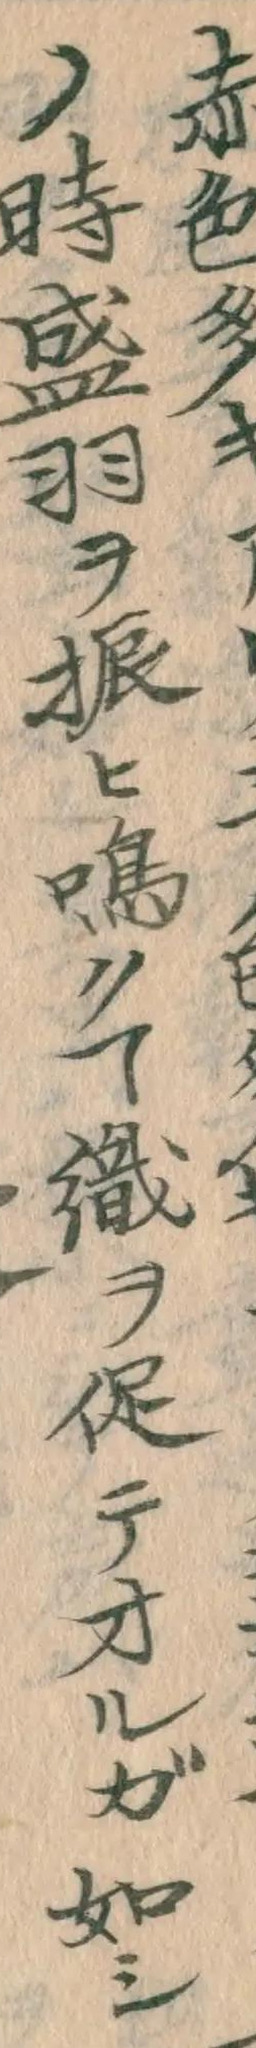ノ時盛羽ヲ振ヒ鳴クコト織ヲ促テオルガ如シ
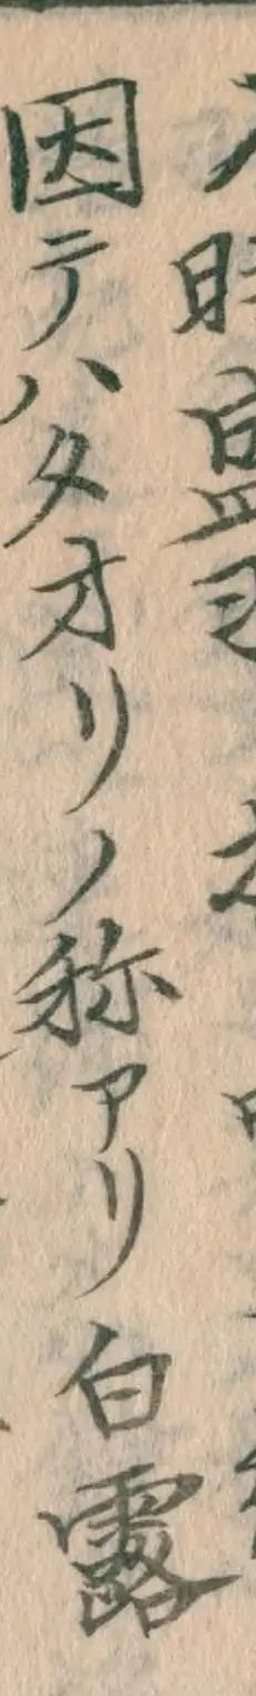因テハタオリノ称アリ白露
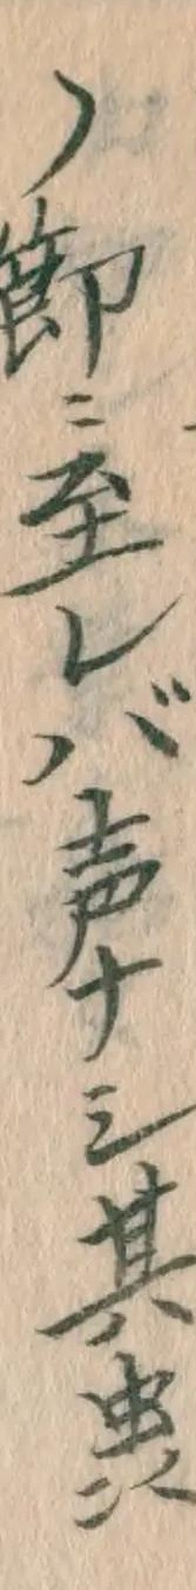ノ節ニ至レバ声ナシ其蟲
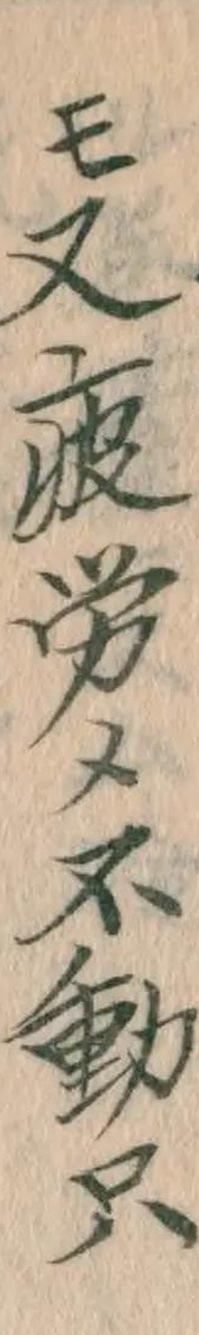モ又疲労シテ不動只
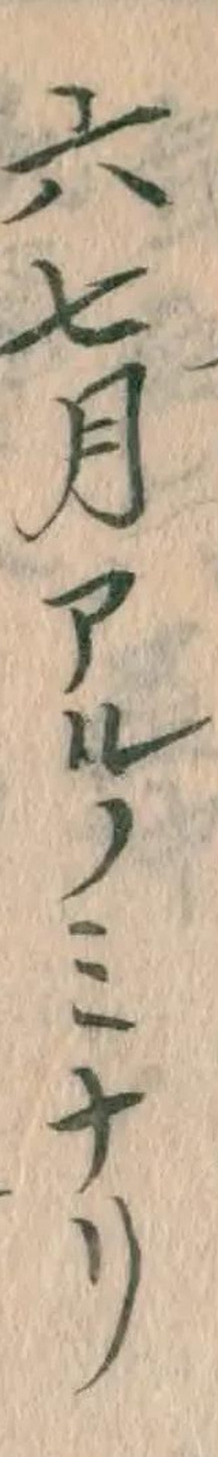六七月アルノミナリ
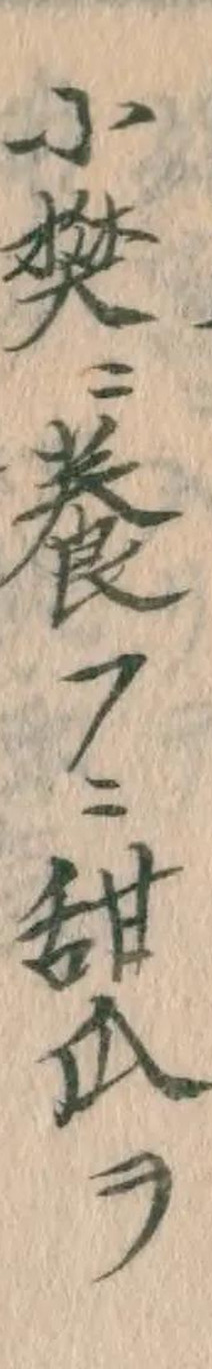小焚ニ養フニ甜瓜ヲ
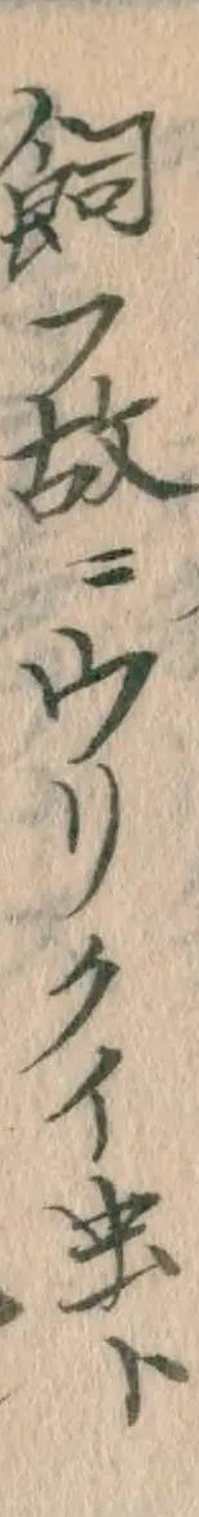飼フ故ニウリクイ虫ト
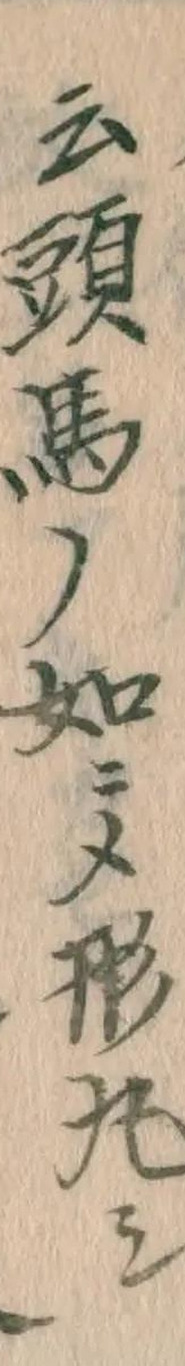云頭馬ノ如ニシテ形丸シ
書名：千蟲譜 3巻. [3]
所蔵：国立国会図書館 National Diet Library, JAPAN
